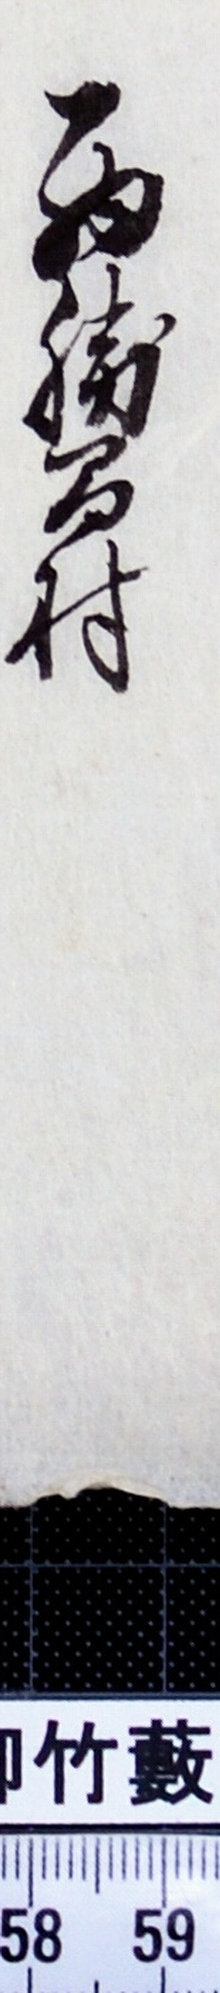西勝間村
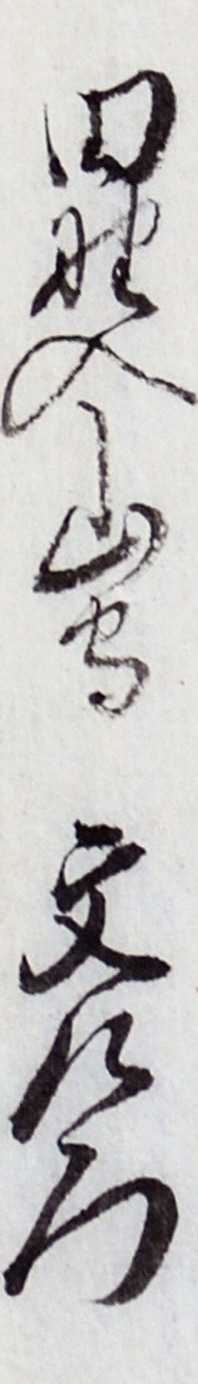田野入山守文左衛門
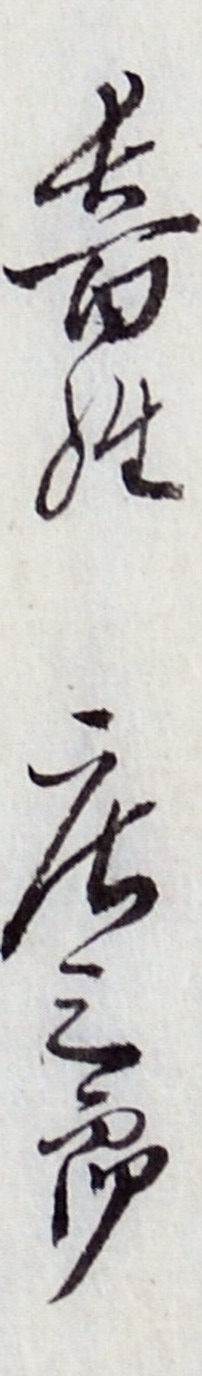長百姓庄三郎
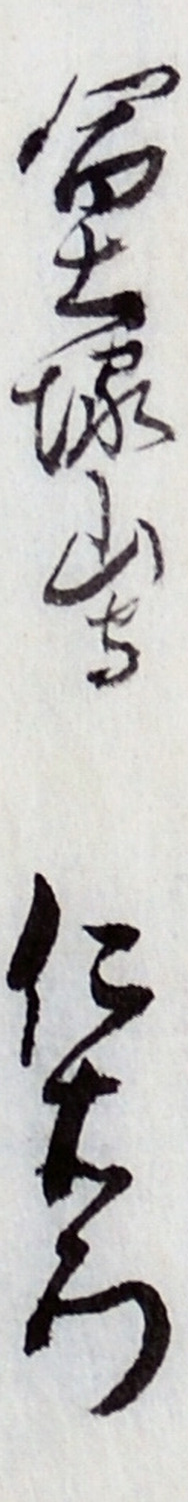冨士塚山守仁右衛門
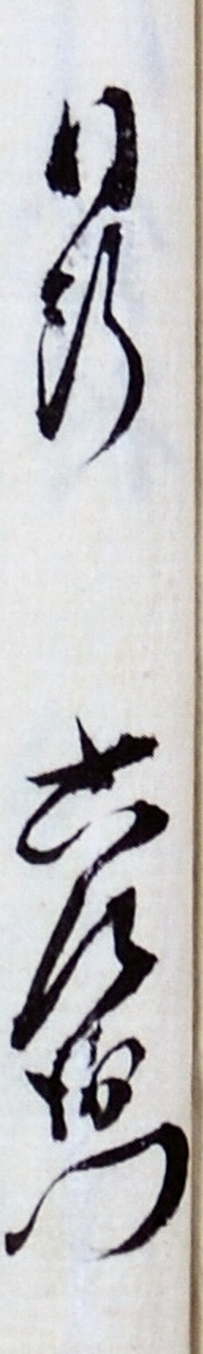同断六左衛門
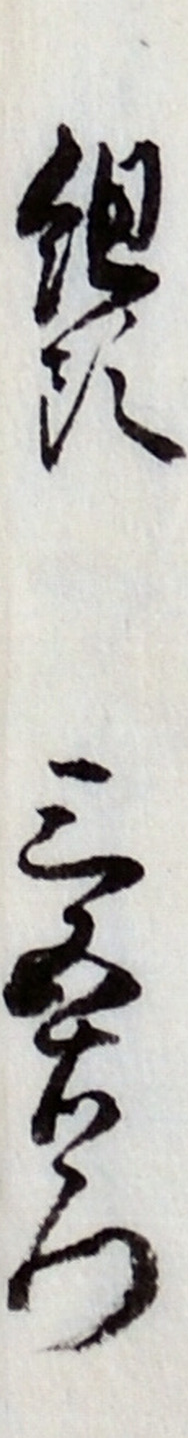組頭三五右衛門
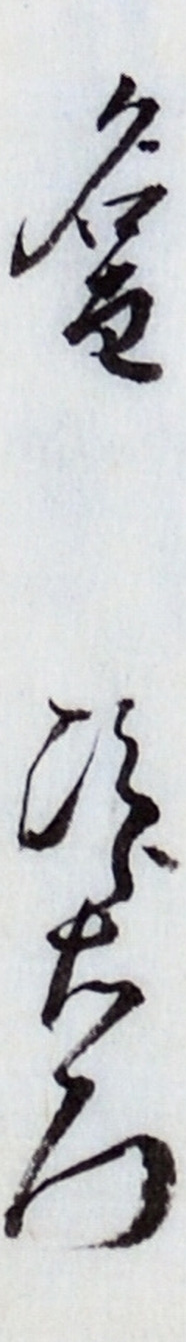名主次郎右衛門
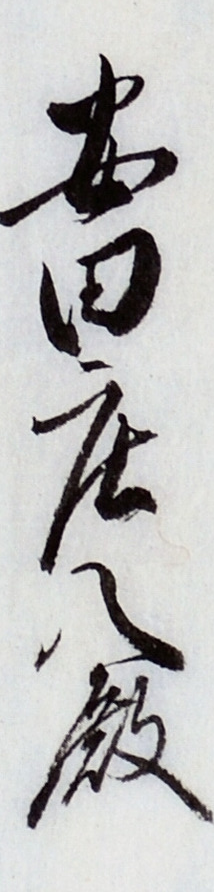安田庄八殿
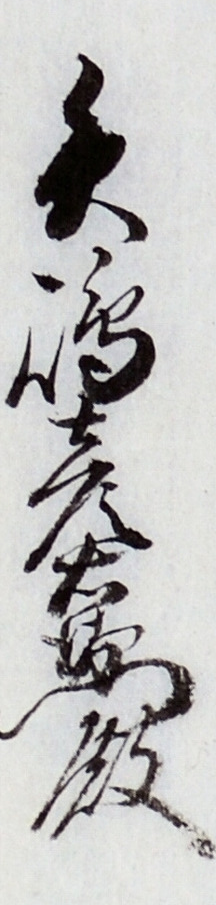矢嶋彦右衛門殿

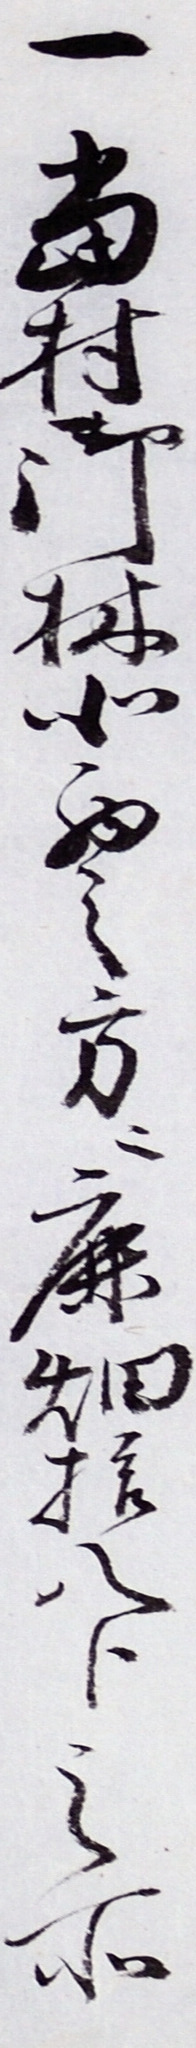一当村御林北西之方ニ麁畑拾八分之所
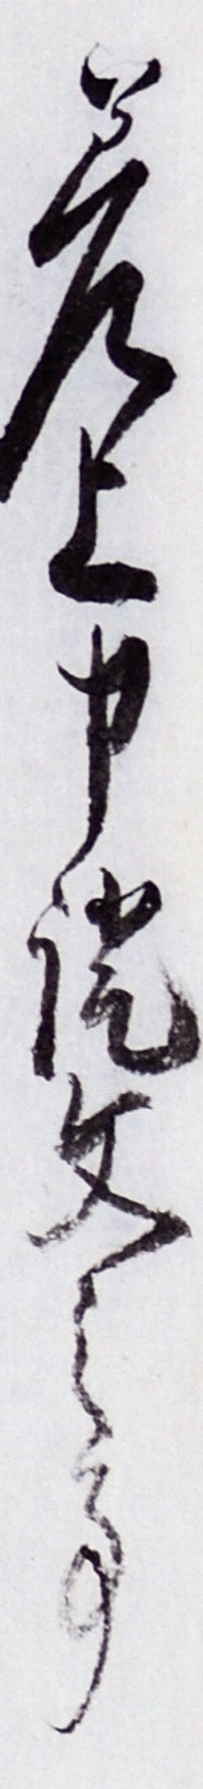差上申証文之事
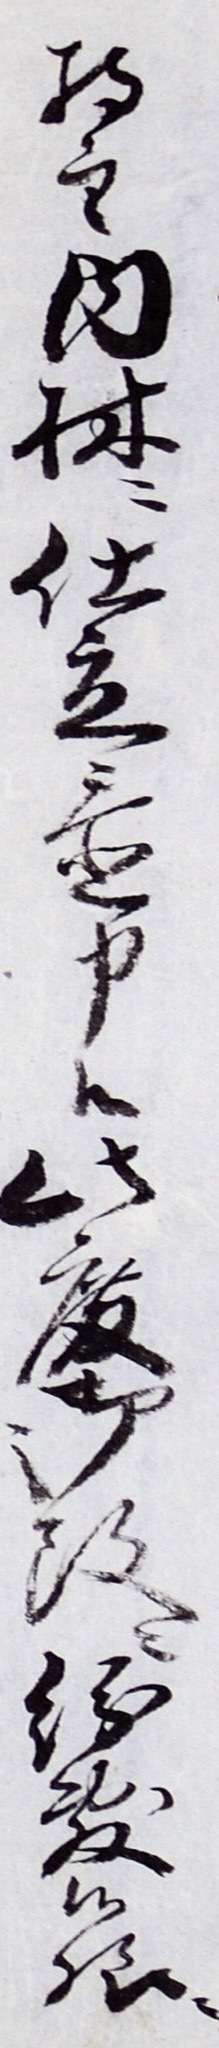持主内林ニ仕立置申候此度御改ニ紛敷候様ニ
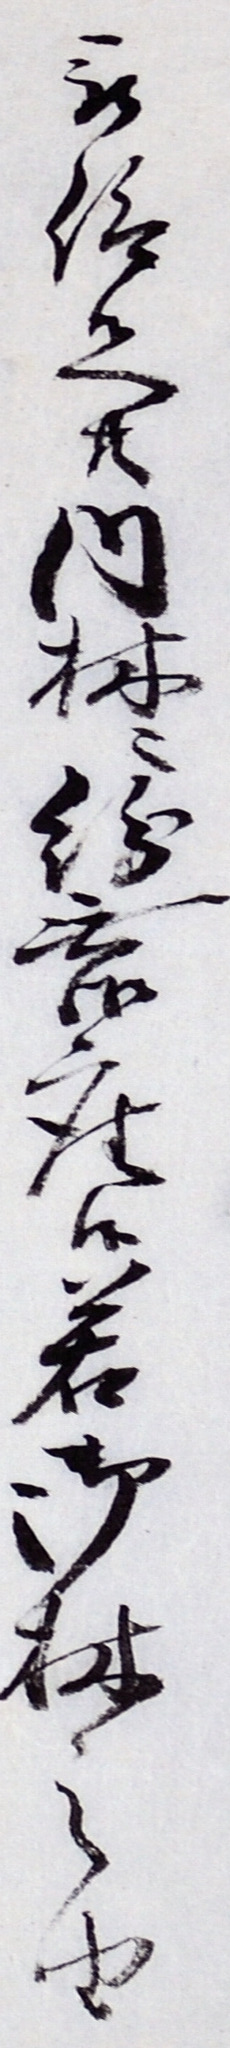被仰候へ共内林ニ紛無御座候若御林之由
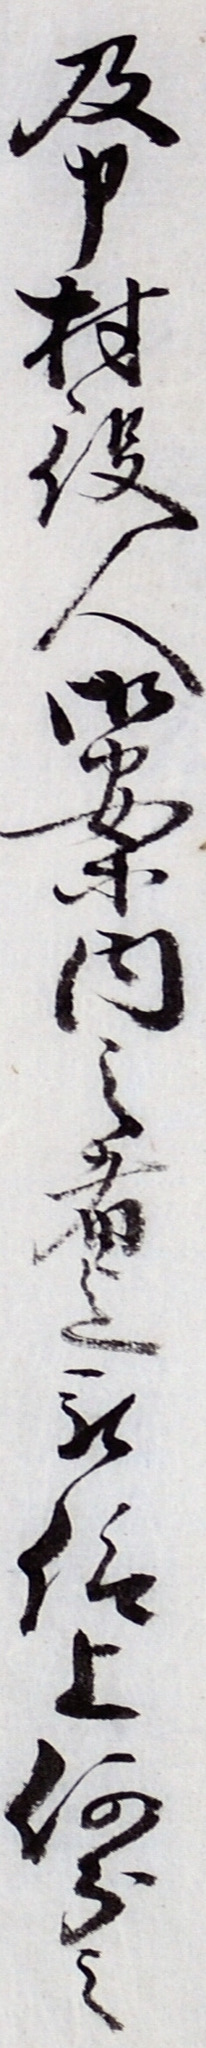及申村役人御案内之者迄被仰上何分之
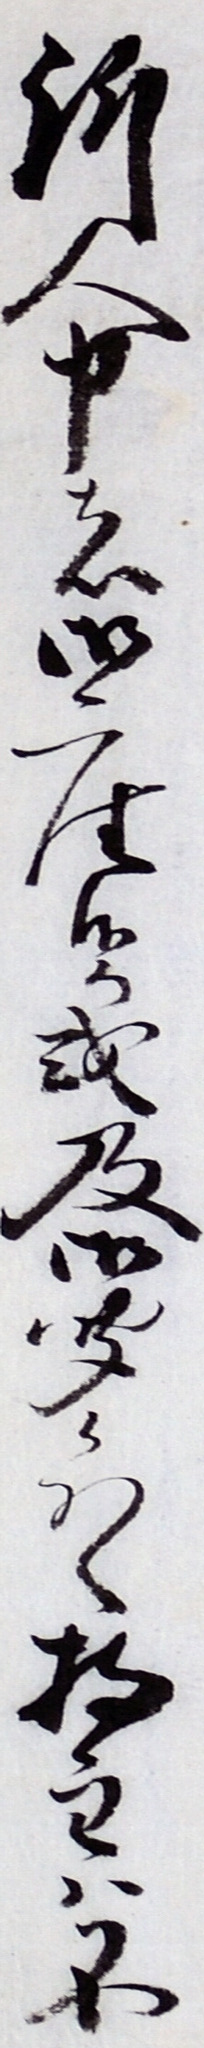訴人申者御座候か或及御聞候ハヽ持主ハ不
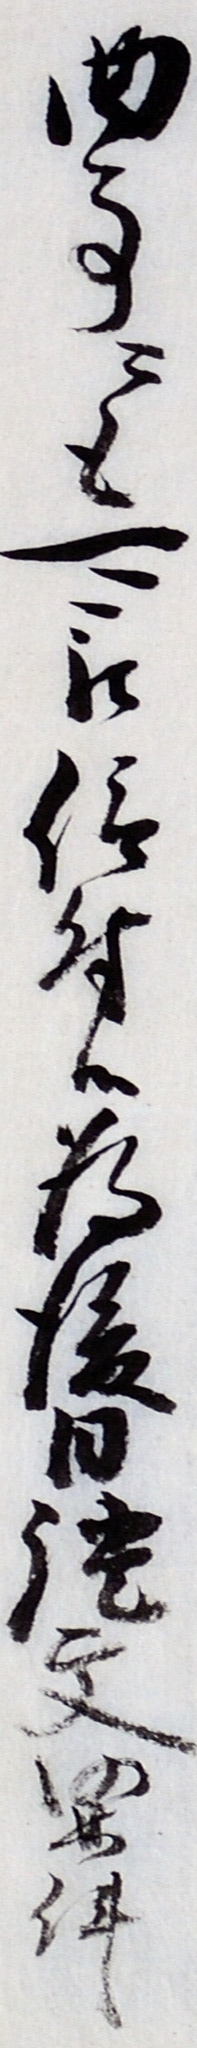曲事ニも可被仰付候為後日証文仍如件
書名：御林御竹藪証文控
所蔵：伊那市立高遠町図書館・合同会社AMANE
